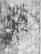南
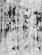陵
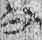公
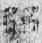郘
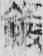襄
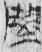陵
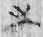之
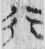行
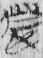○（僕）
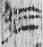於
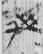○（鄢）
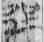郢
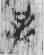疋
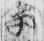命
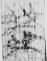○（葬）
